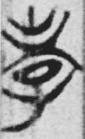孝
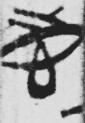志
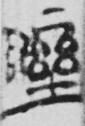○（隰）
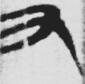又（有）
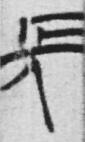長（萇）
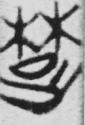楚
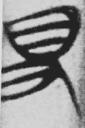○（得）
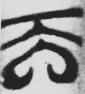而
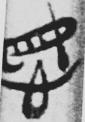○（悔）
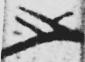之
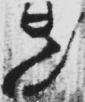也
